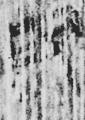母（毋）
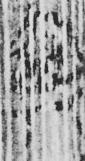○（暴）
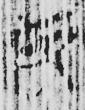母（毋）
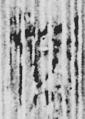○（虐）
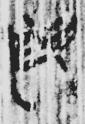母（毋）
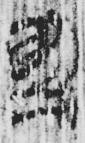惻（賊）
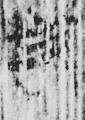母（毋）
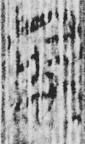念（貪）
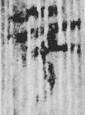不
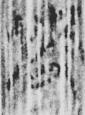攸（修）
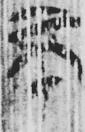不
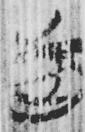武〈戒〉
